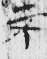不
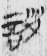○（察）
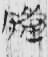○（陳）
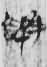顀
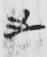之
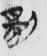傷
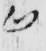㠯（以）
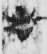告
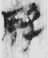阩
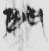門
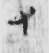又
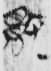敗
